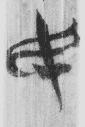民
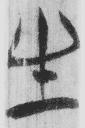生
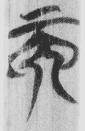而
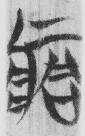痌
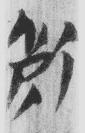死
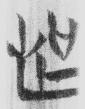喪
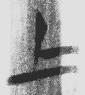上
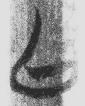㠯（以）
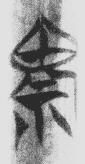{鬼示}
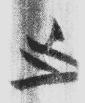之
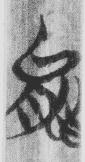能
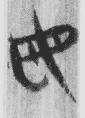母
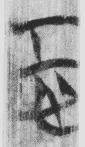{工心}
